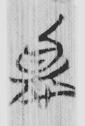{勺皿}
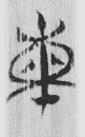柬
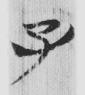子
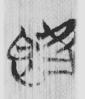既
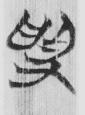受
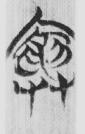{宀黽廾}
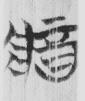𨟻
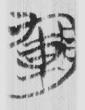軍
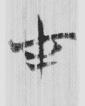才
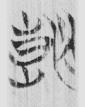朝
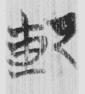{車㔾}
